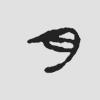月
